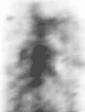馬
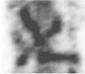之
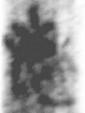○（轡）
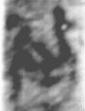紫
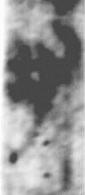勒
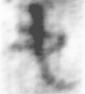屯
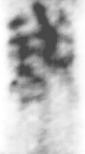戠（黓）
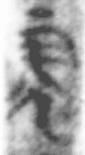○（蒙）
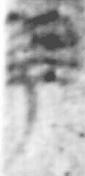○（羽）
